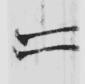二
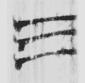三
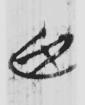臣
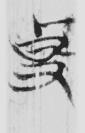史
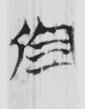於
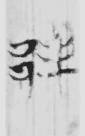邦
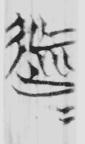{辶巟}=
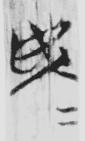𡚦=
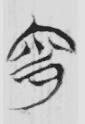宵
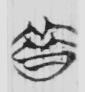昔
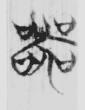器
